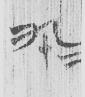九十=
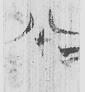八十=
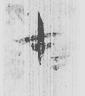七十=
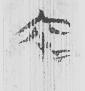六十=
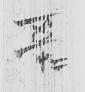五十=
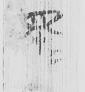四十=
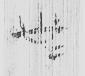卅=
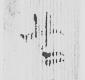廿=
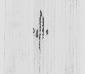十
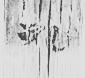九
